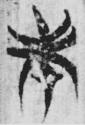未
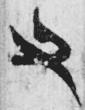又（有）
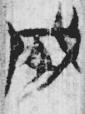成
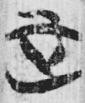正（政）
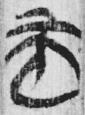而
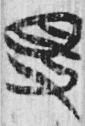○（得）
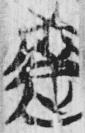○（失）
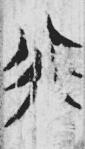行
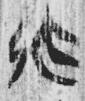於
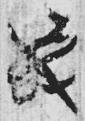民
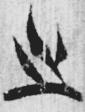之
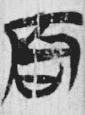○（厚）
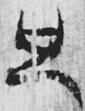也
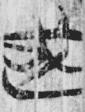或
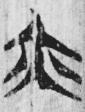亦
